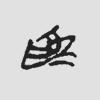爲
